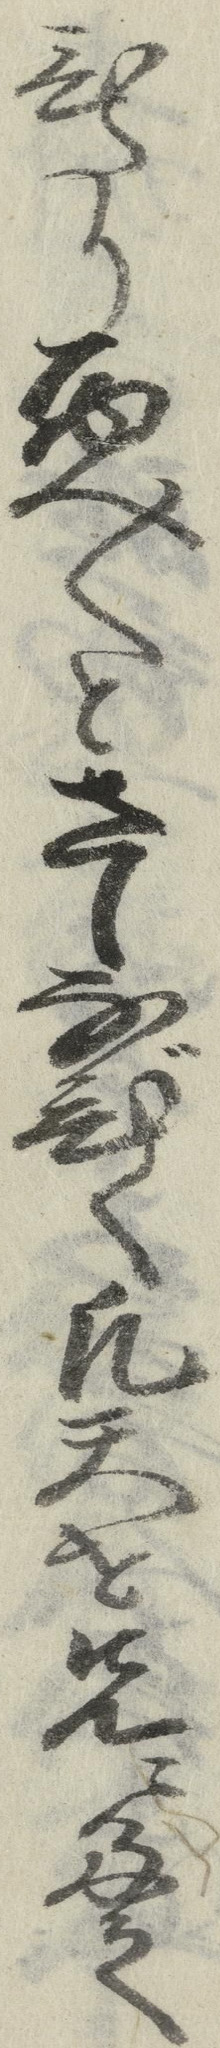至たり西へ〳〵とさしなびく凡天を先にたて
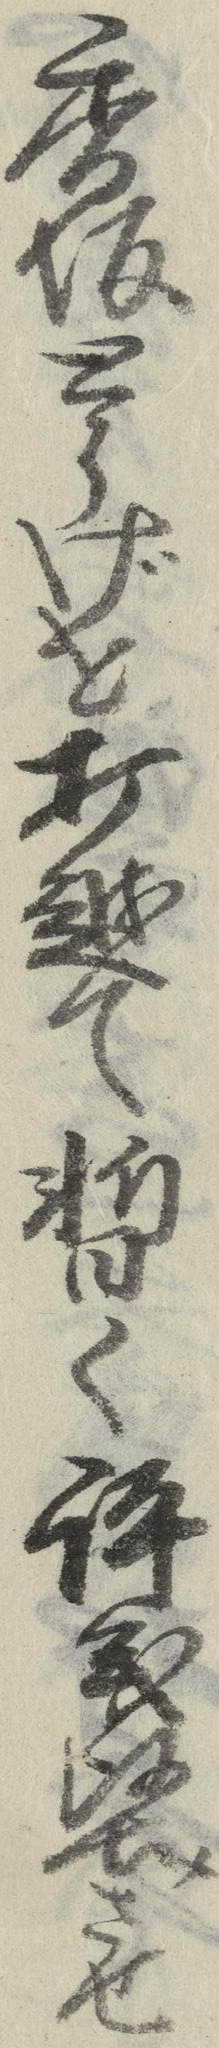香坂とうげを打越て暫く評義堅
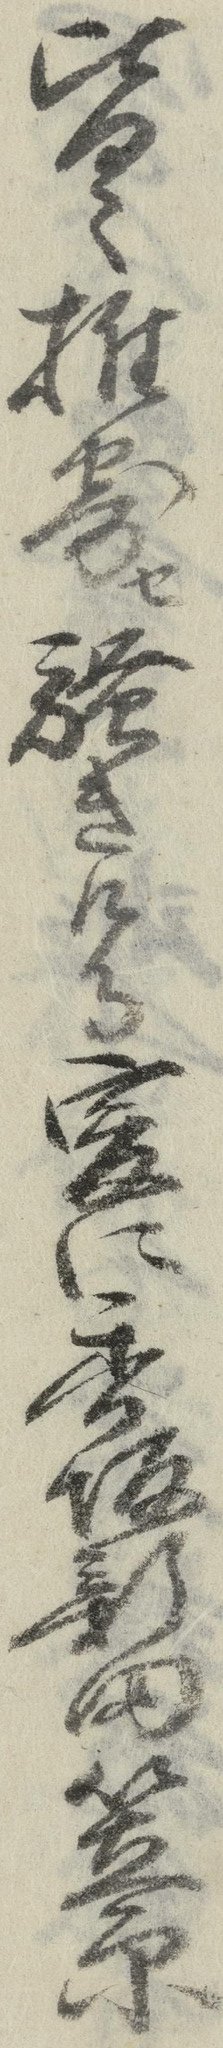皆々推寄騒きける爰に香坂新田笠原

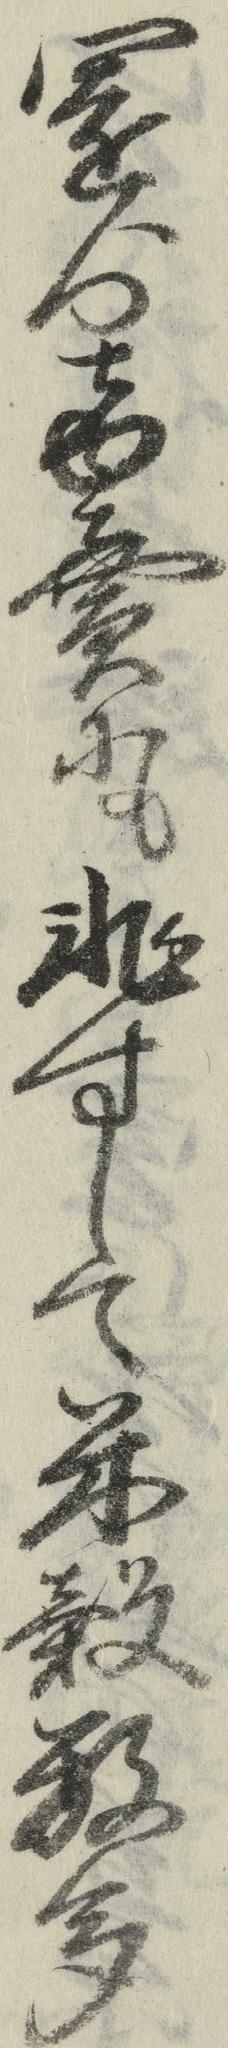還候売買にも非すして米穀数多
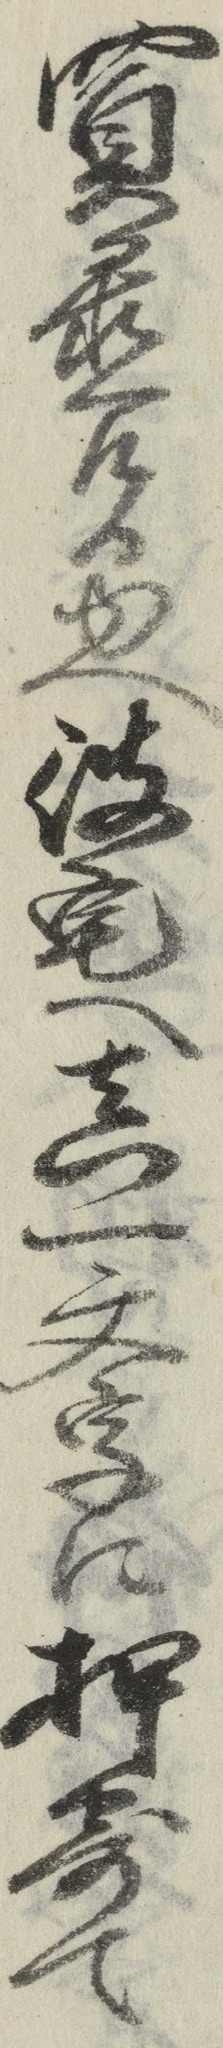買置けるゆへ彼宅へ真一文字に押寄て
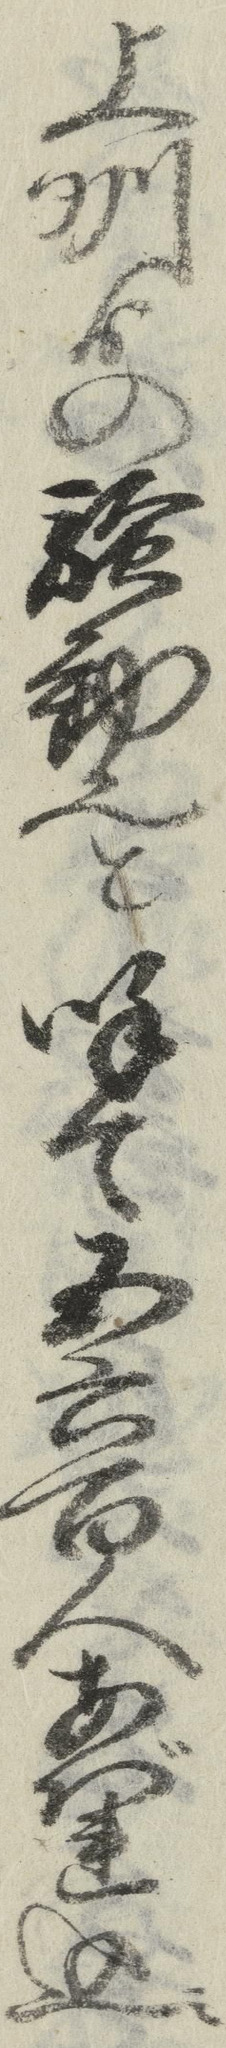上州ゟの騒動也と呼て五六百人あバれ込み
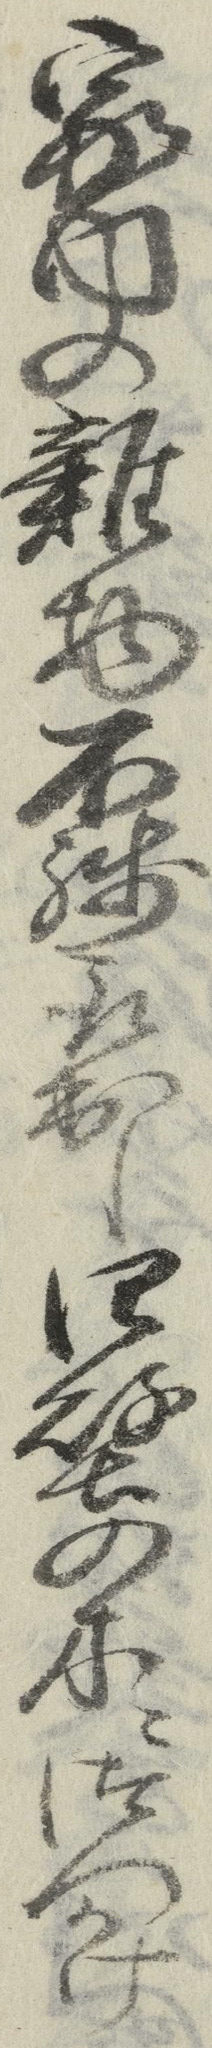家内の雑物不残取出し四壁の木にたつかけ
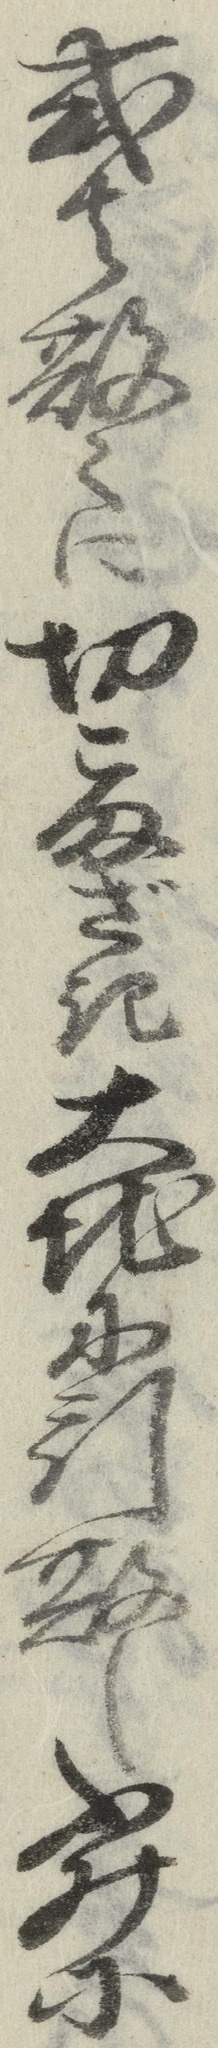或は散々に切こまざき大地に引散しふみに
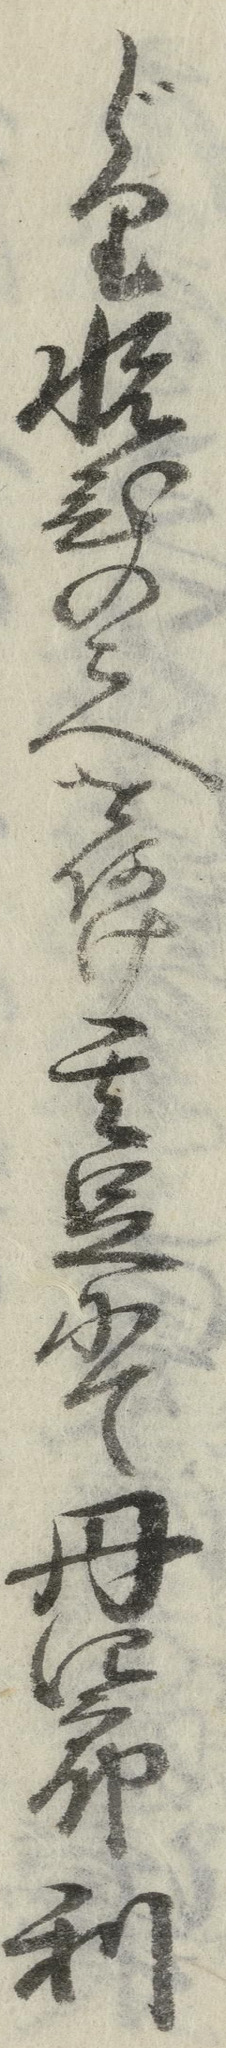じり悦ひのこへをあけ其足にて丹四郎利
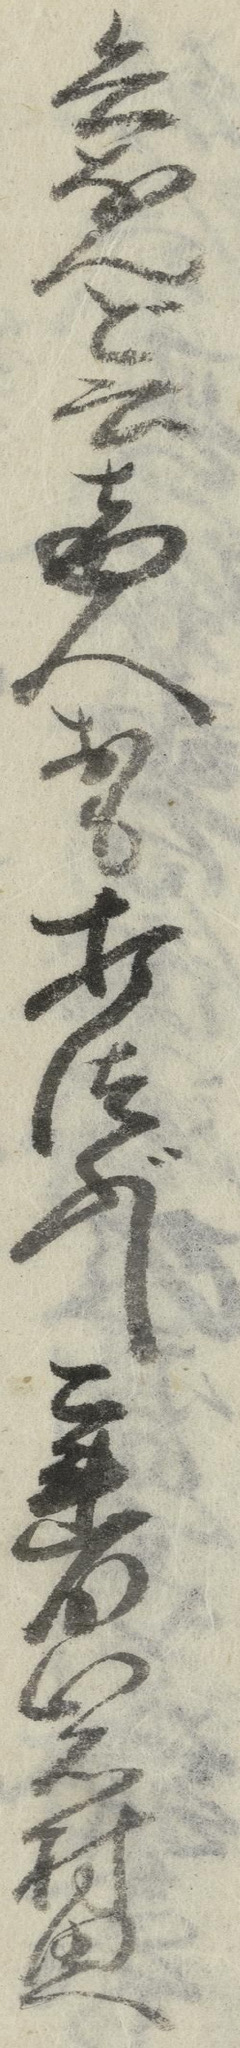兵なんど云両人おも打つぶしこれゟ岩村田へ
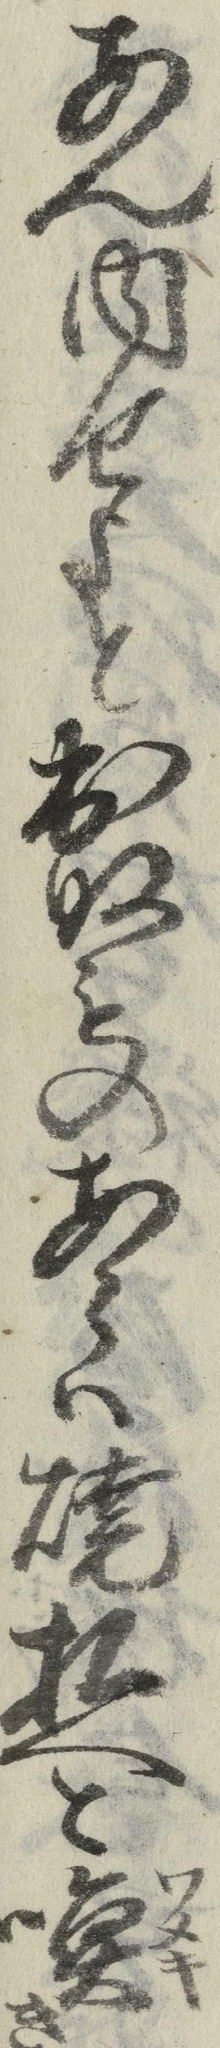あん内せよと出ぬものあらは焼払へと喚き
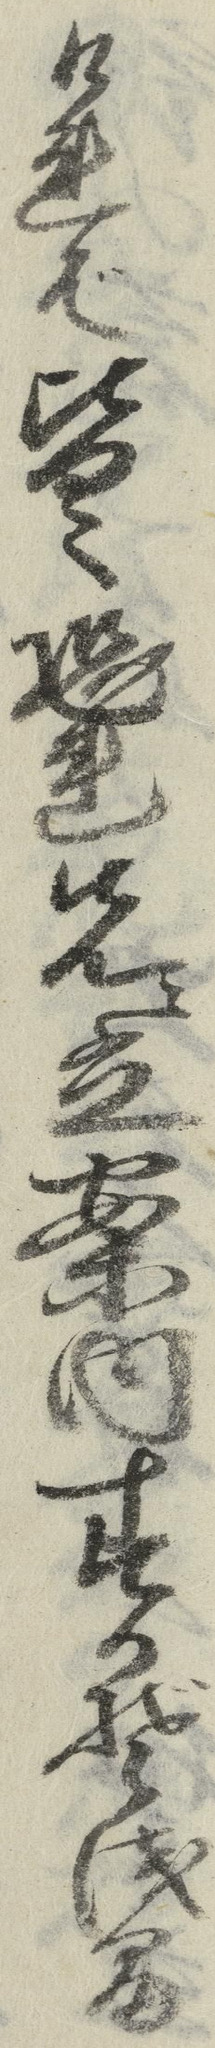ければ皆々恐れ先に立案内するぞ浅間
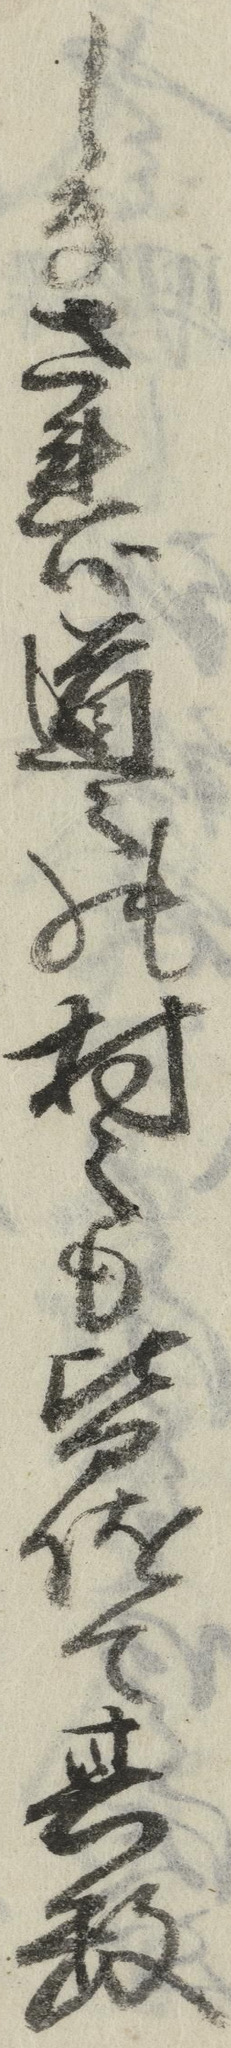しきされば道々の村々も皆随て其数
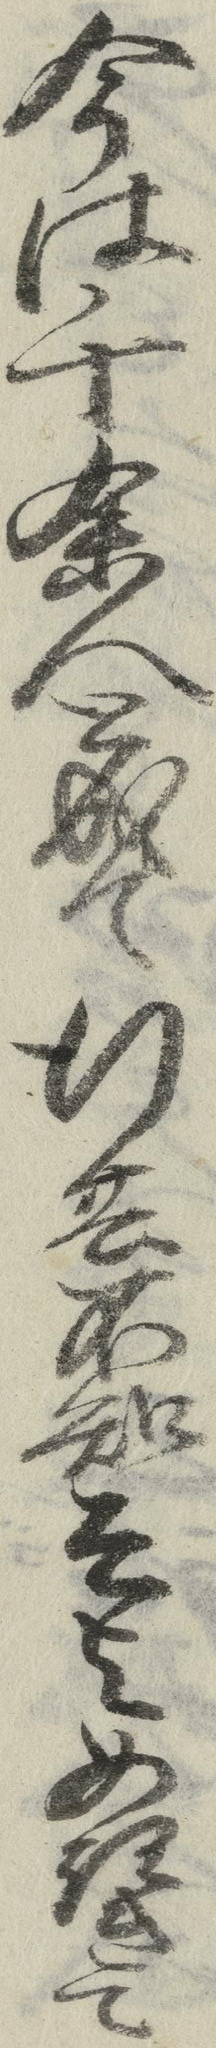今は千余人と成て行甚不知とよめきて
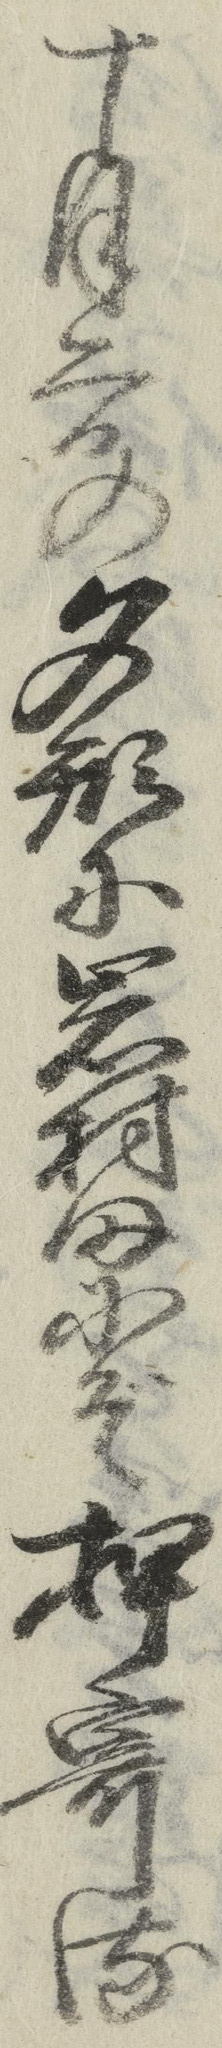十月二日の夕形に岩村田にぞ押寄る
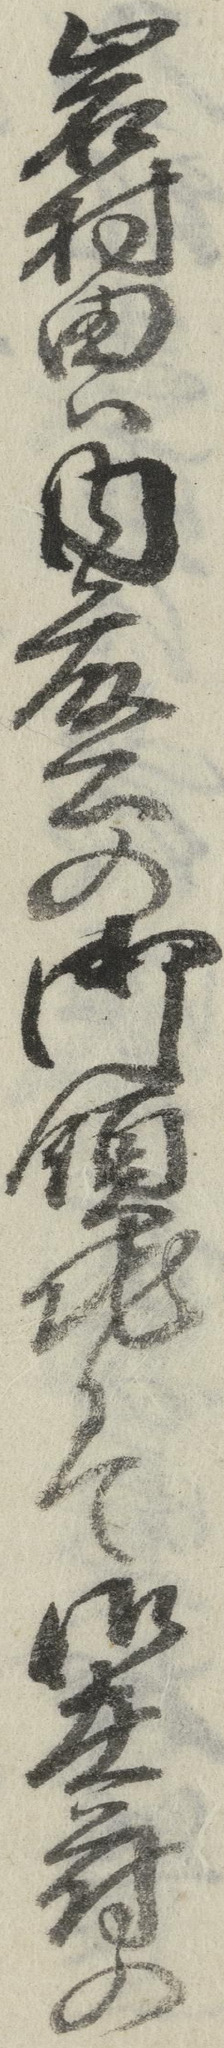岩村田は内藤公の御領地にて御在府の
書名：浅間大焼騒動記　中
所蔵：東京大学地震研究所図書室 Earthquake Research Institute Library, The University of Tokyo, JAPAN
